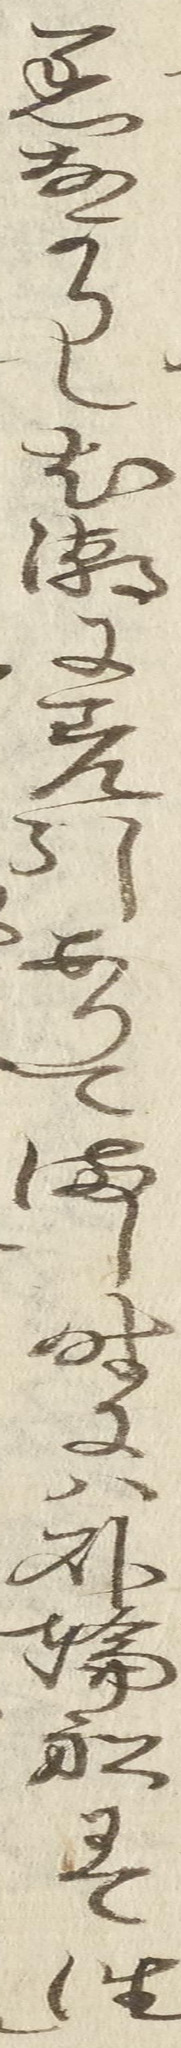恙なかりし尤潮に差引ありて満し時には外輪船にて往
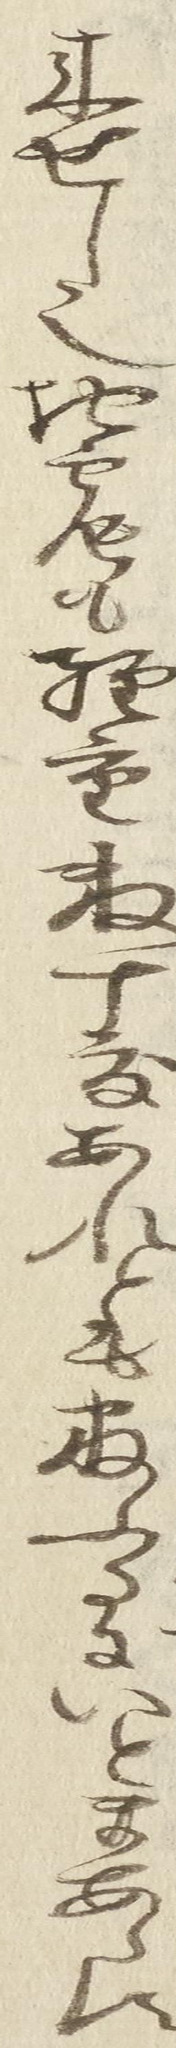来せし也地震も軽重数十度あれとも数ふるにいとまあらす
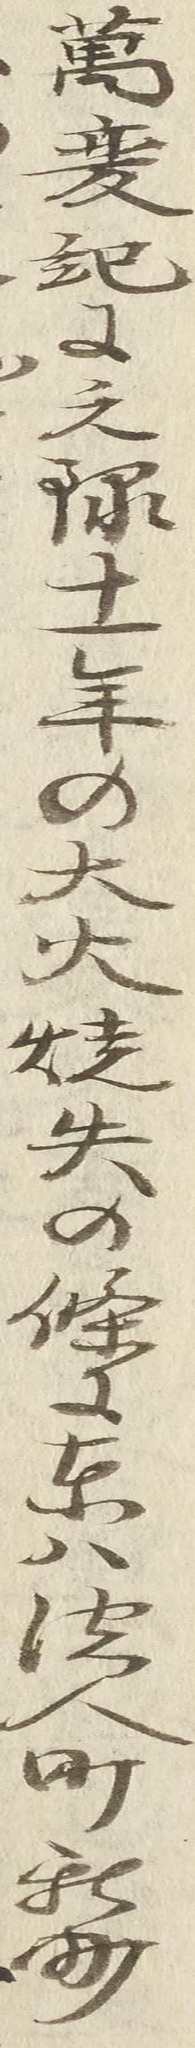萬変記に元禄十一年の大火焼失の条に東は濃人町新町
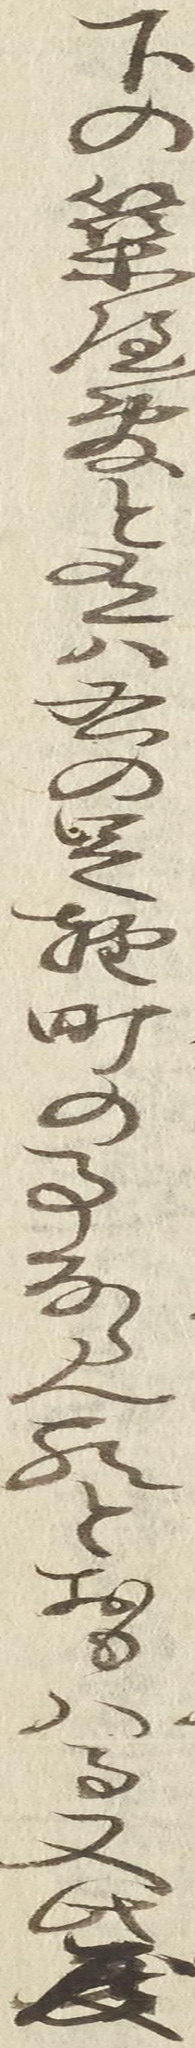下の築屋敷と有は右の足軽町の事ならん歟とおもはる又此度
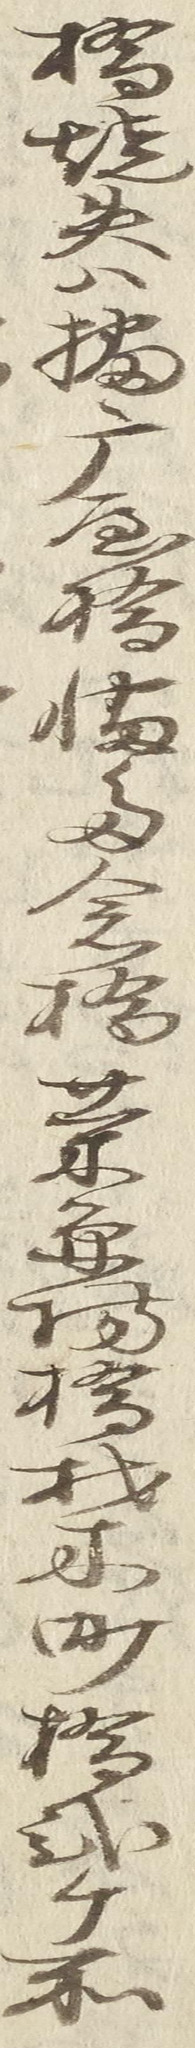橋焼失は播磨屋橋播多倉橋菜圓場橋材木町橋弐ヶ所
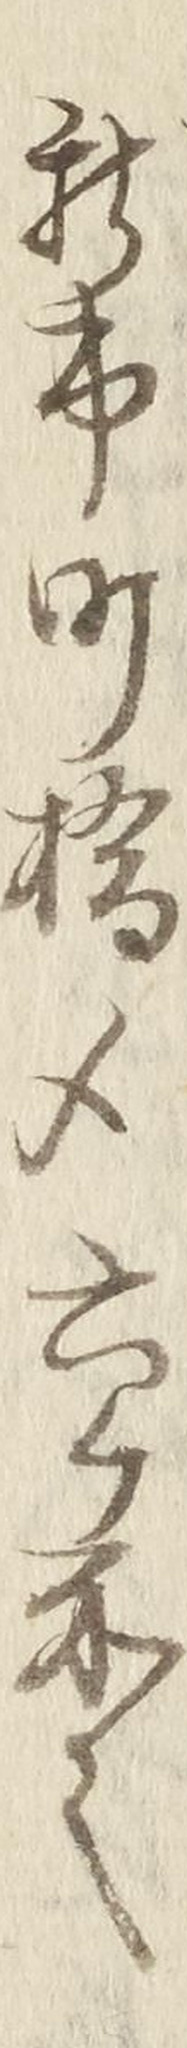新市町橋〆六ケ所也
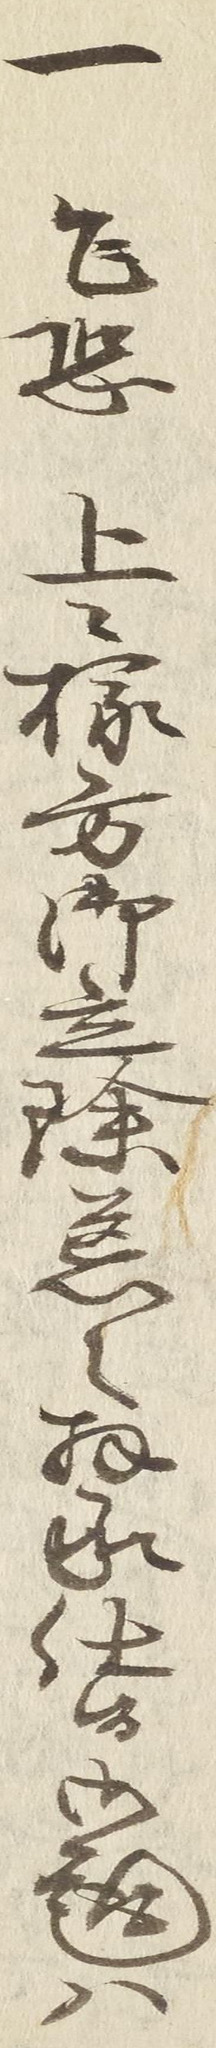一乍恐上々様御立除荒之拝承仕候御趣は
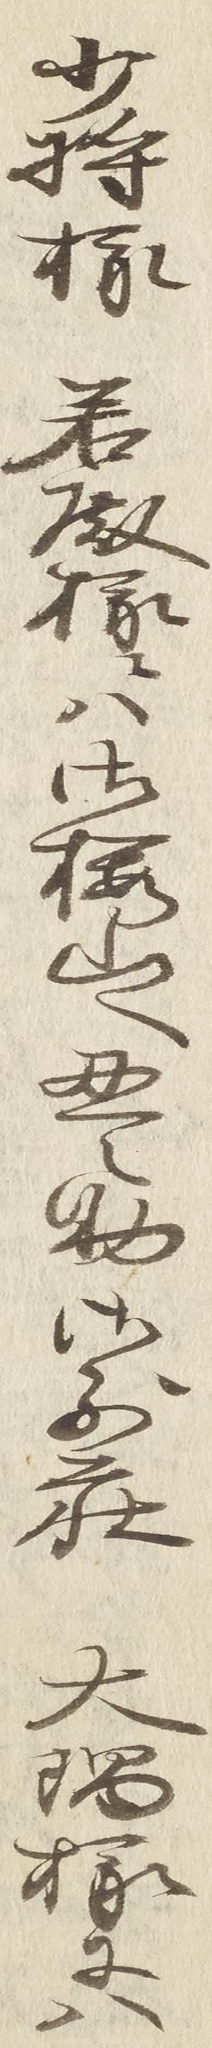少将様若殿様には御桜山へ丑之助御別荘大隅様には
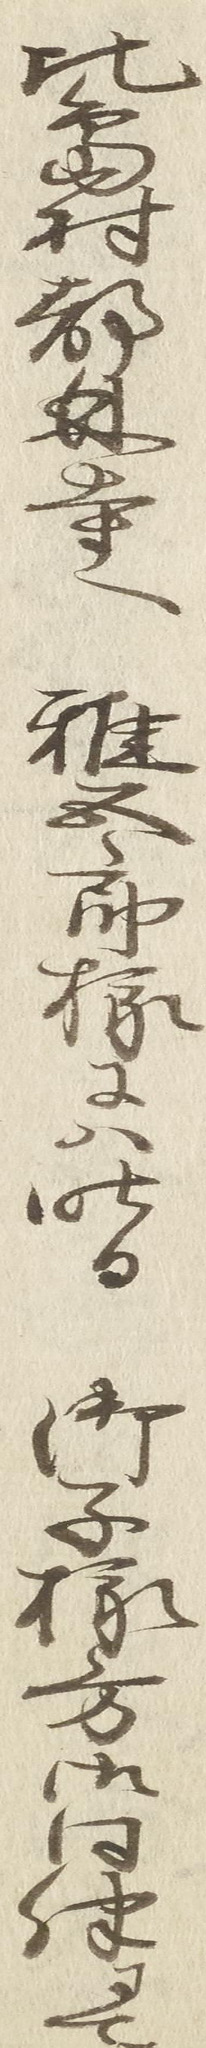比島村静林寺へ雅五郎様には昨日御子様方御同伴にて
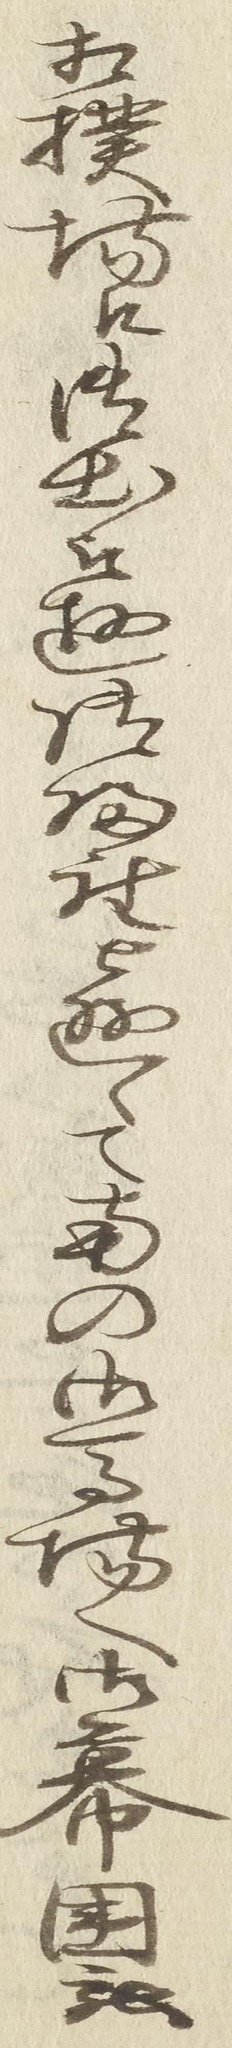相撲場え御出被遊御帰座被遊候て南の御馬場へ御幕囲被
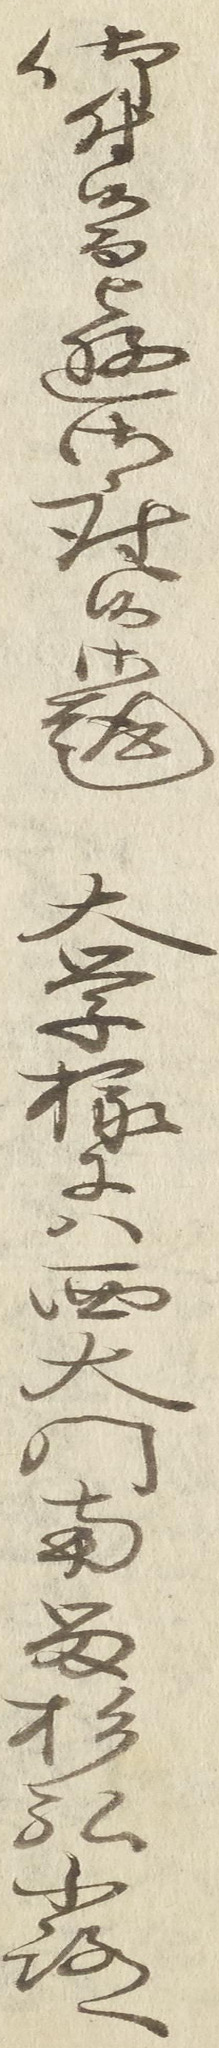仰付候而被遊御座候御趣大学様に西大門南留杉弘小路へ
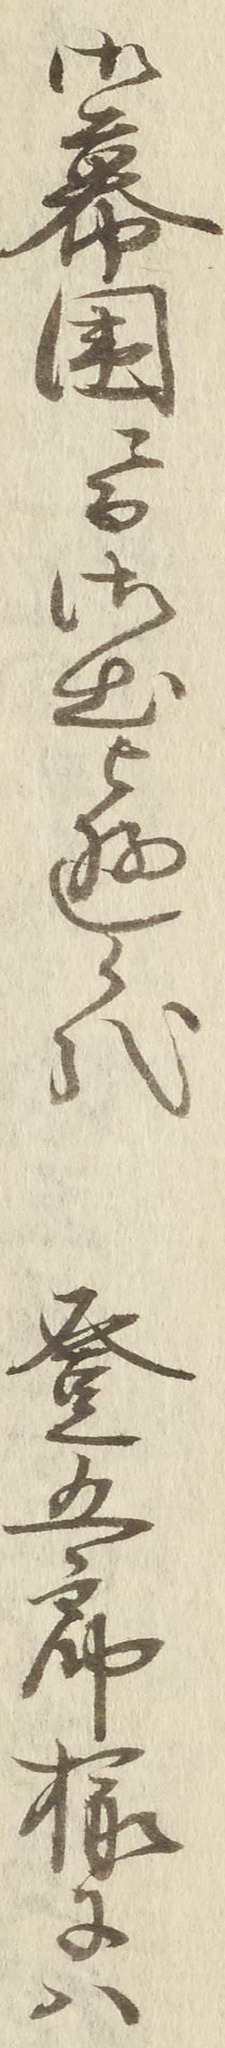御幕囲にて御出被遊候哉登五郎様には
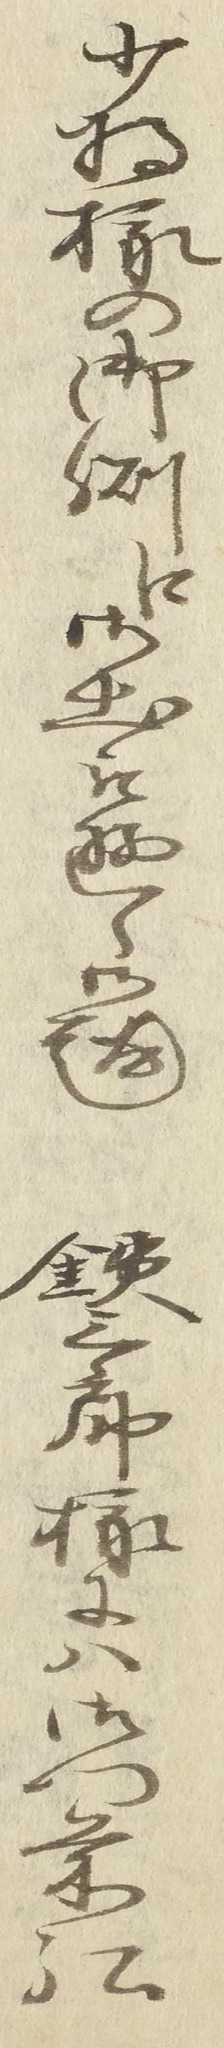少将様の御側え御出被遊候御趣銕三郎様には御門前弘

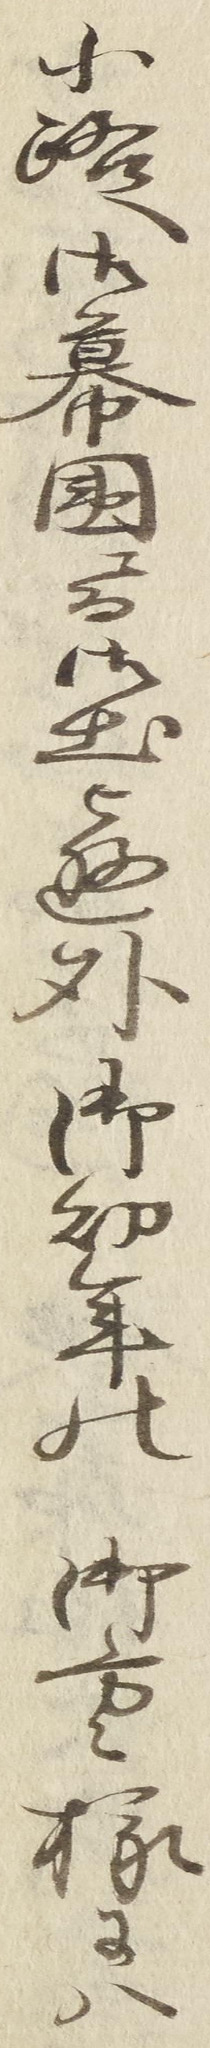小路御幕囲いにて御出被遊外御幼年の御方様には
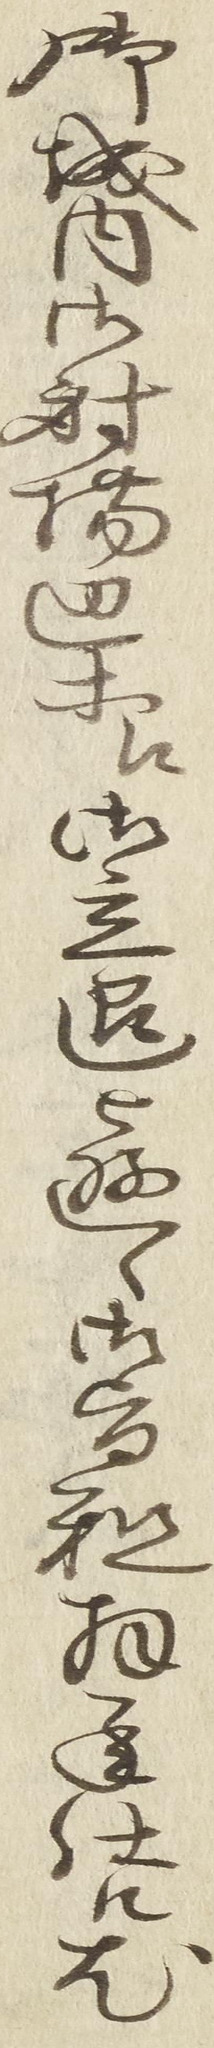御城内御射場辺等え御立退被遊候御旨粗拝承仕候尤
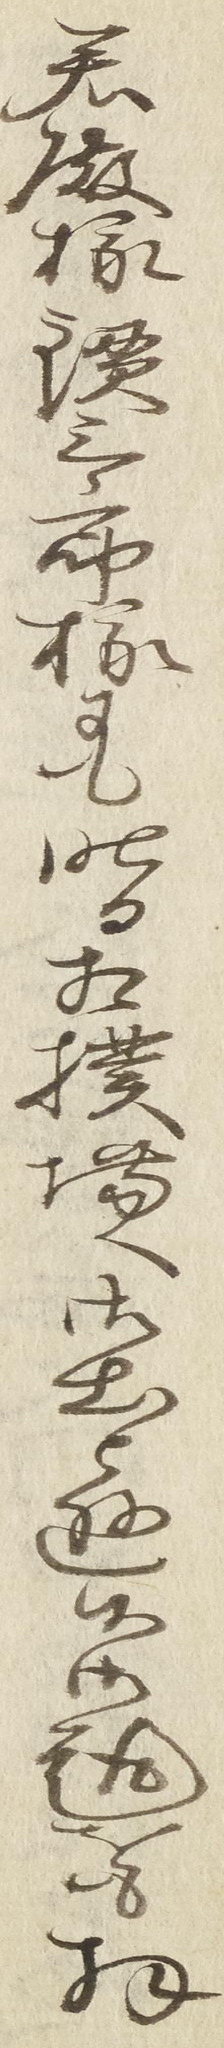若殿様銕三郎様にも昨日相撲場へ御出被遊候御趣をも拝
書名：地震記　上
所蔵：東京大学地震研究所図書室 Earthquake Research Institute Library, The University of Tokyo, JAPAN
